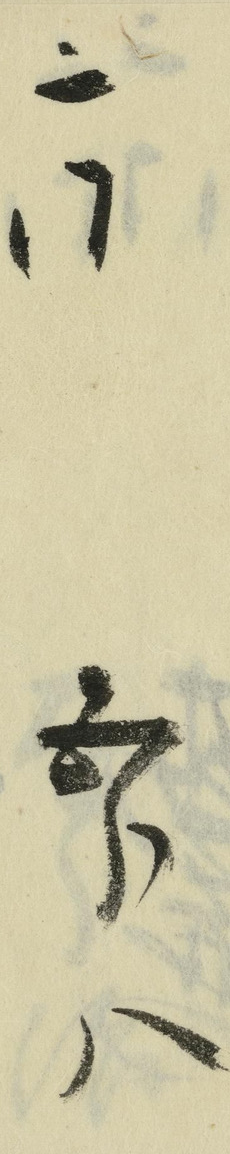一同五郎八
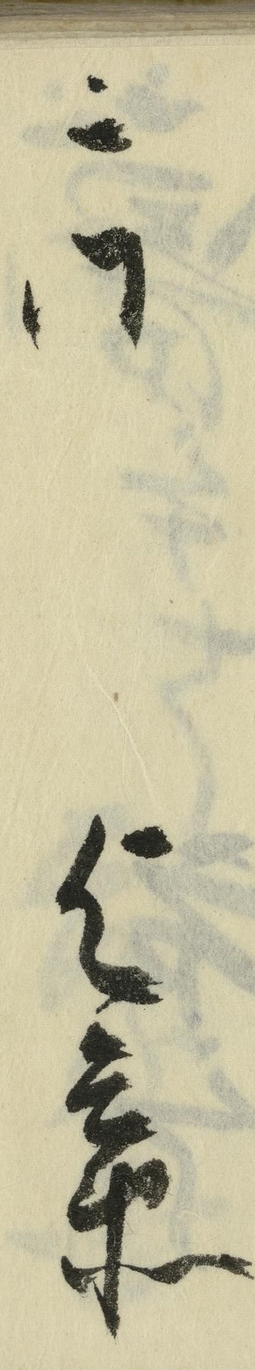一同与兵衛
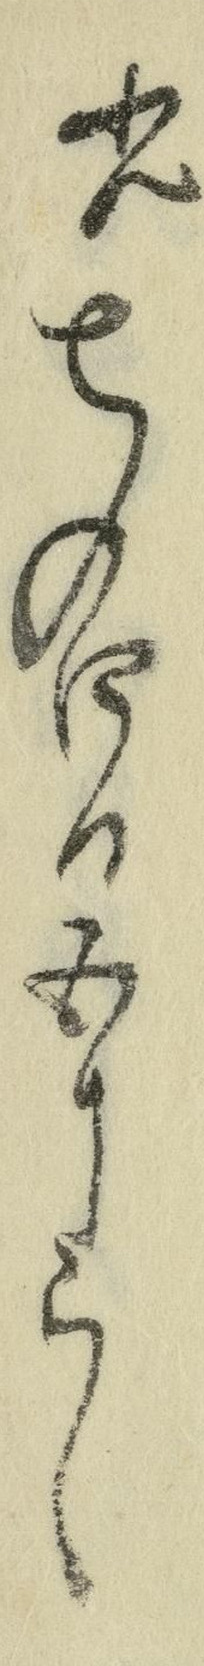小以七〆四百五十三文

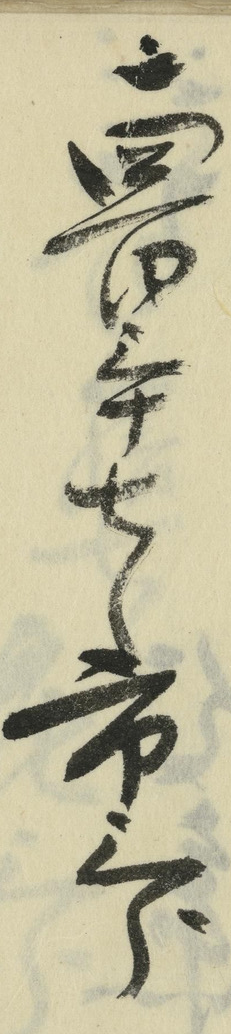一四百三十七文市三郎
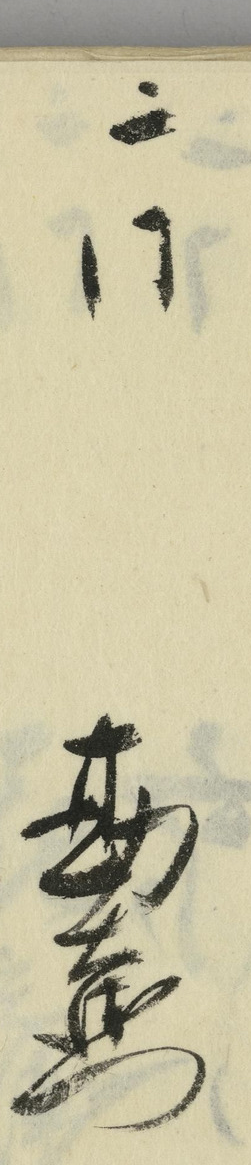一同勘右衛門
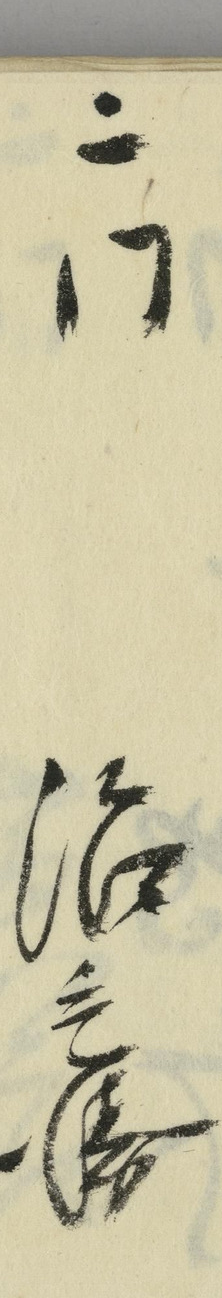一同治兵衛
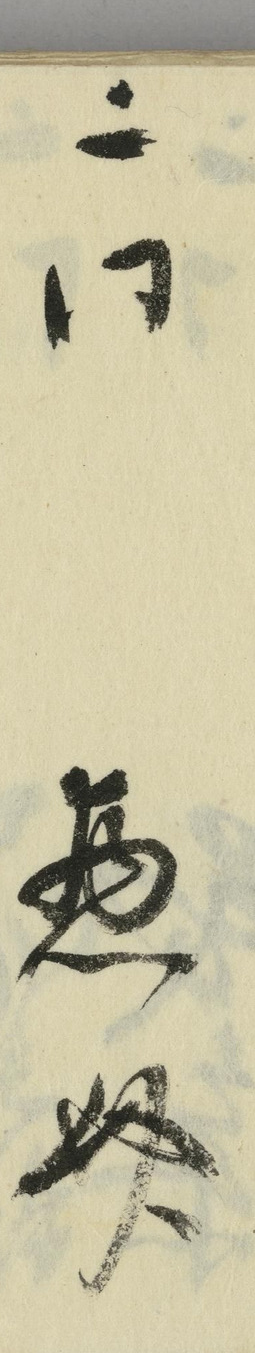一同惣介
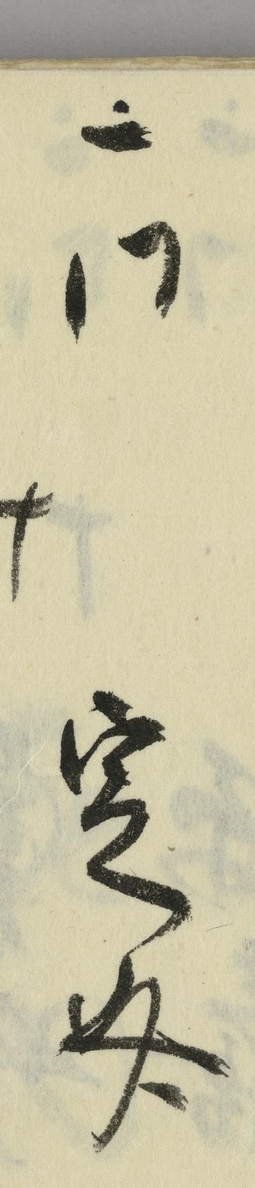一同定介
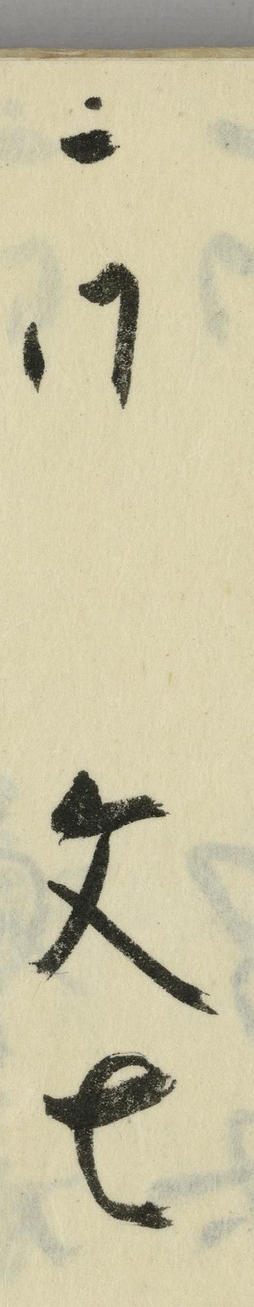一同文七
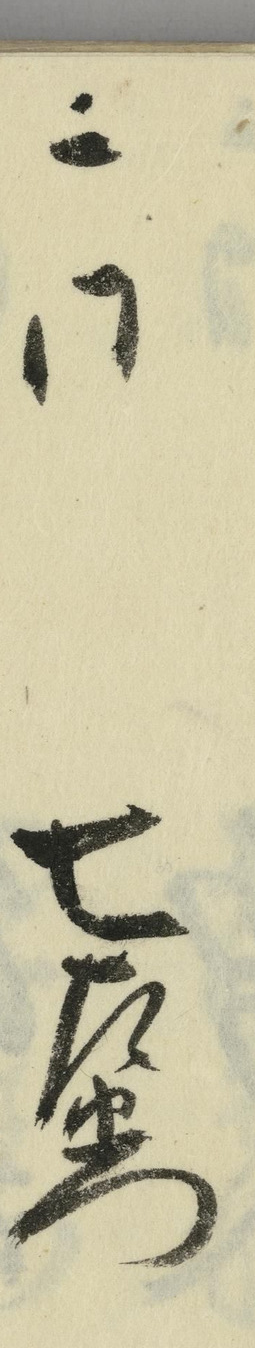一同七左衛門
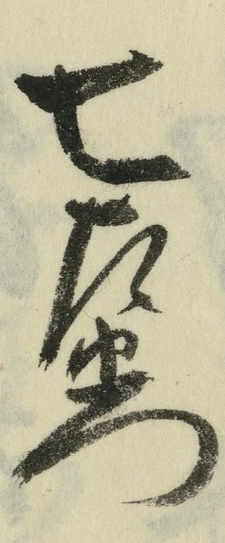十左衛門
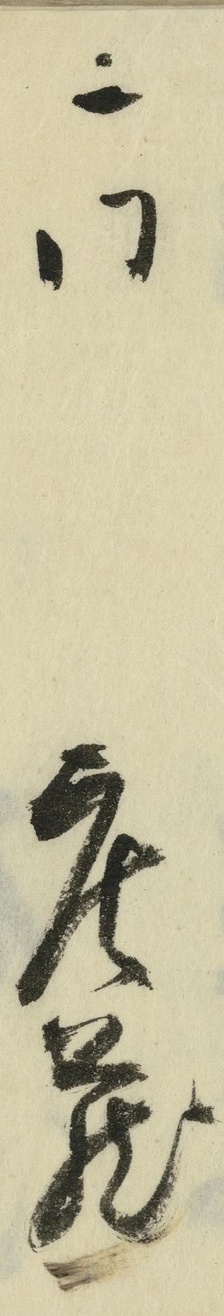一同庄蔵
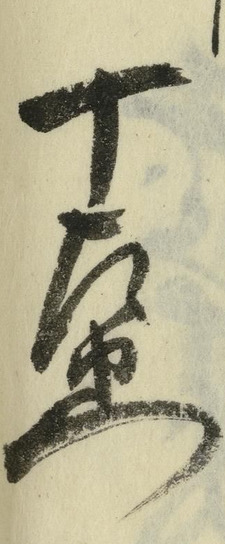十左衛門
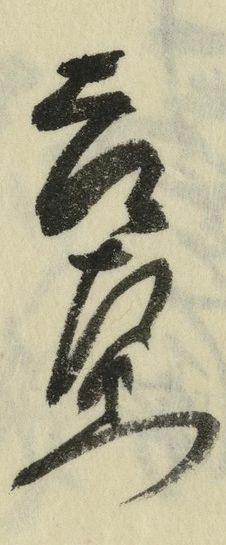十左衛門

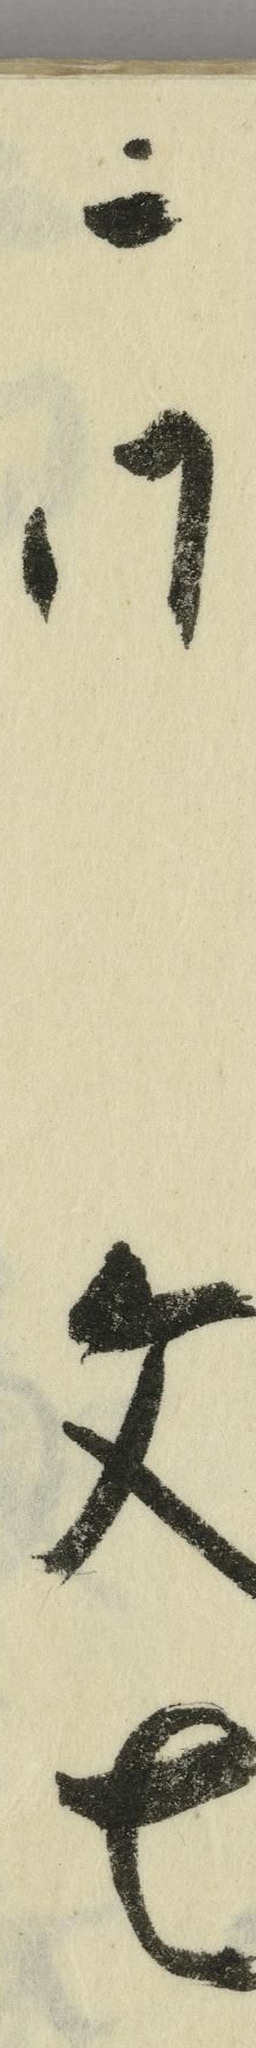一同金七
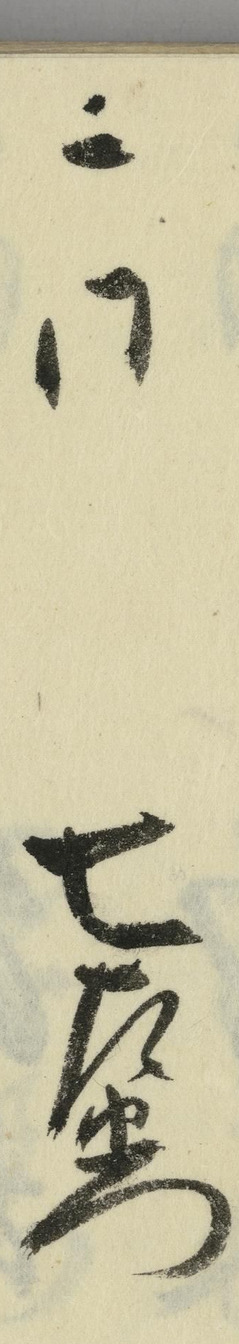一同吉左衛門
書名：天明淺間噴火ニ関スル書類
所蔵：東京大学地震研究所図書室 Earthquake Research Institute Library, The University of Tokyo, JAPAN
